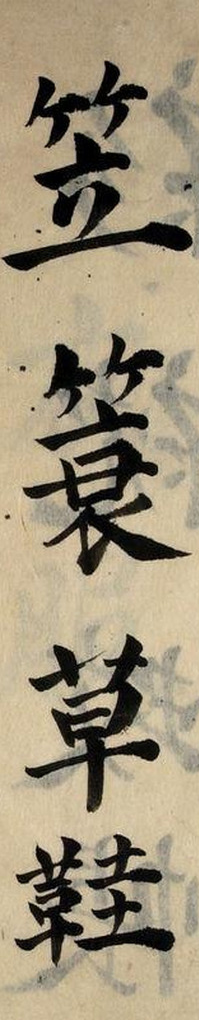笠簑草鞋
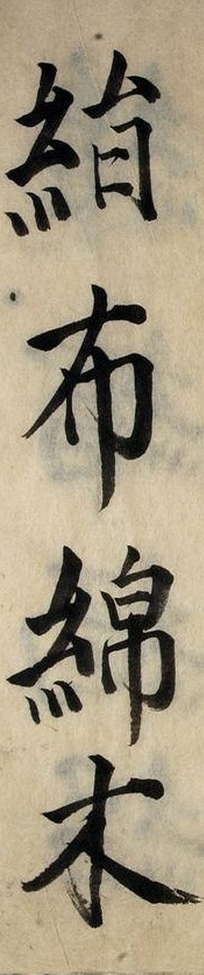絹布綿木

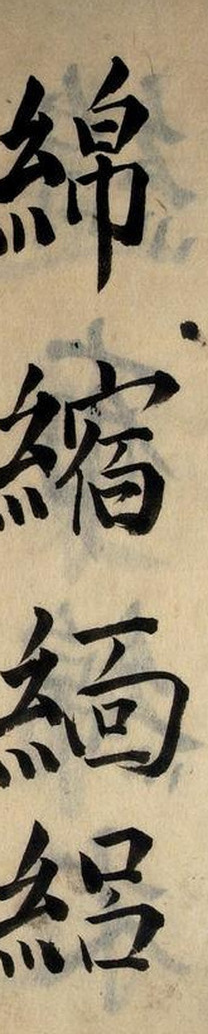綿縮緬絽
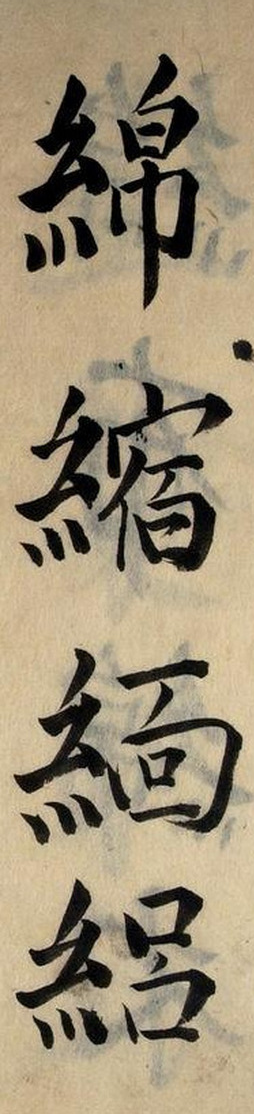綿縮緬絽
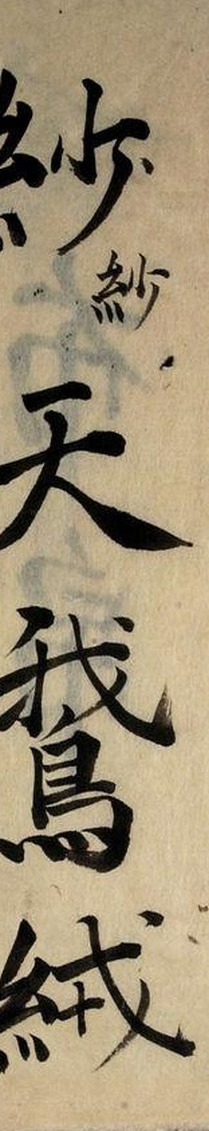紗天鵞絨

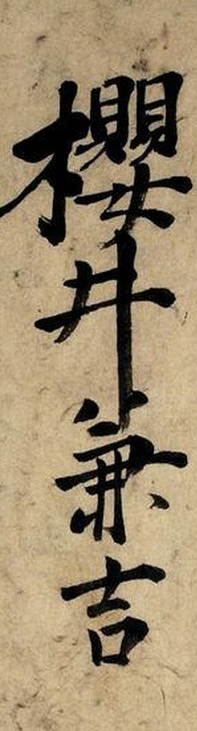櫻井兼吉
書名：御手本（手習）
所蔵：福井県文書館 Fukui Prefectural Archives
